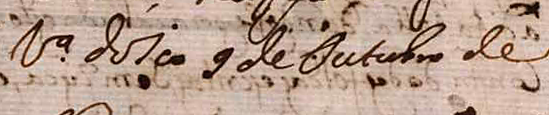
V.a do Ico 9 de Outubro de
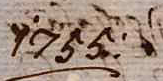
i755:
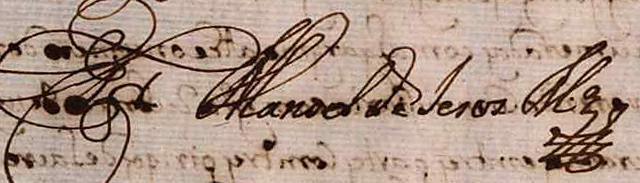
Fr Manoel de Iesuz M.a
